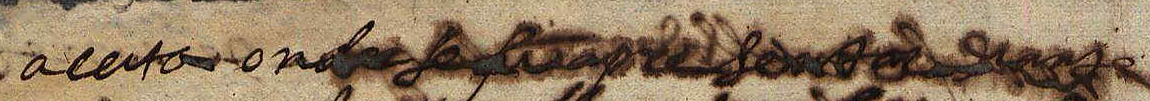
a ceuta onde se foi apresentar diante
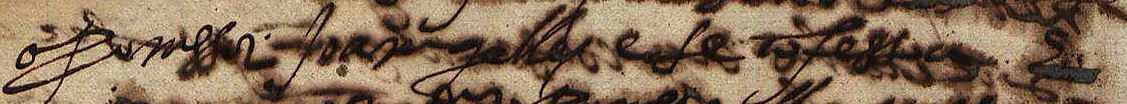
o ꝓouissor Joam galles e se cōfessou E
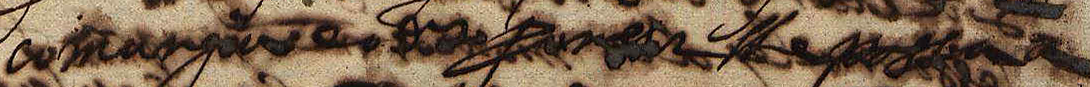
comungou e dos ꝓouissor lhe passou a
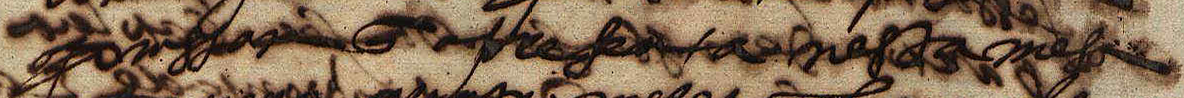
ꝓouissam q̄ apresenta nesta mesa
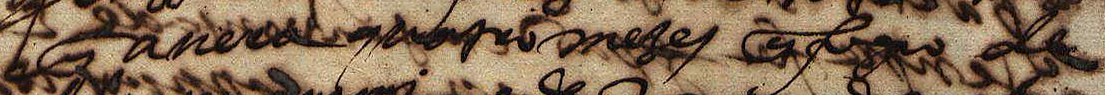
e q̄ auera quatro mezes q̄ fogio de
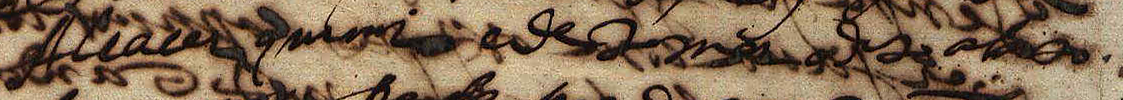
Alcacer quiuir e de tomar o dito abito
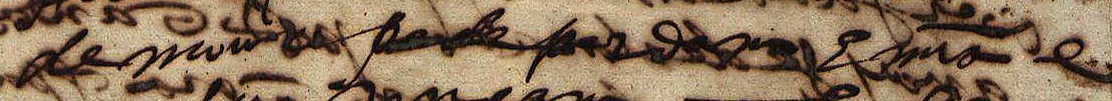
de mouro pede perdam E mīa e
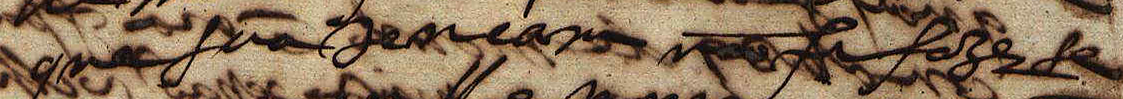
que sua tençam não foi fazer se
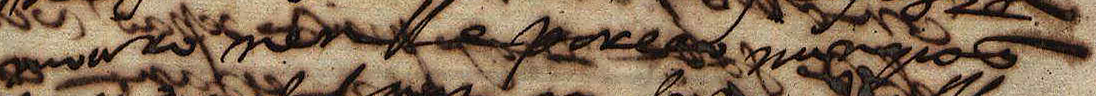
mouro nen lhe pareceo nunqua q̄
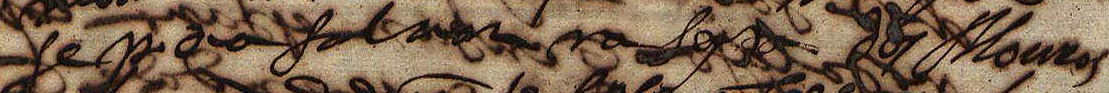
se podia saluar na sejta dos Mouros
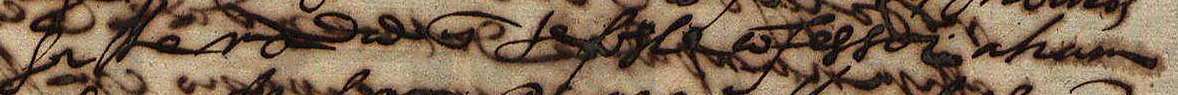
foi lhe mandado q̄ se fosse cōfessar a hum
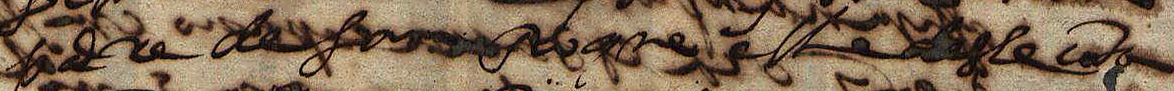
padre de sam Roque e lhe desse cōta
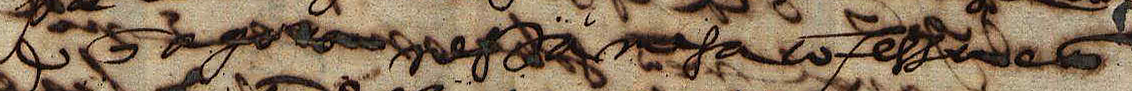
do q̄ agora nesta mesa cōfessa e q̄
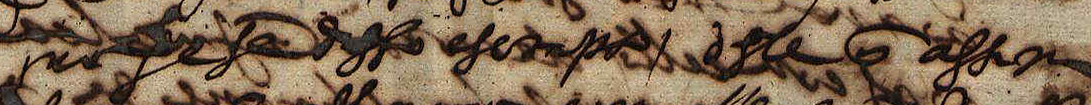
trouxese disso escripto disse q̄ assim
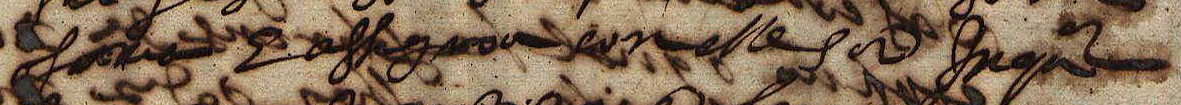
o faria E assignou com elle sor̄ Jnquor
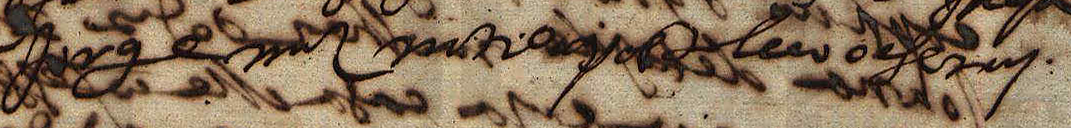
Jorge miz notro apostolico o escruj.
